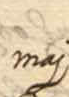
pai
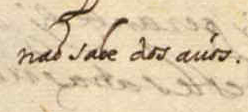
naõ sabe dos auós.
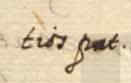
tios pat.
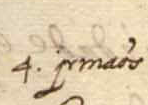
4. jrmaõs
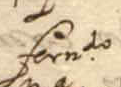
fern.do
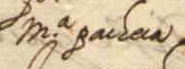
m.a pacheca
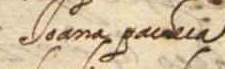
Ioana pacheca
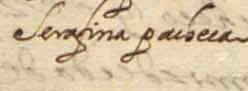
Serafina pacheca
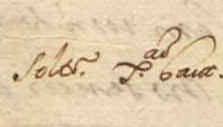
solt.o x.aõ baut.
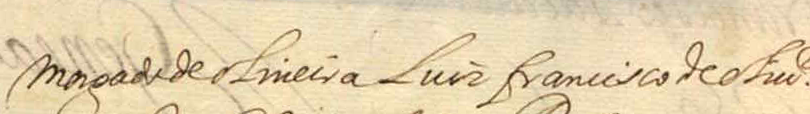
morgado de Oliveira Luiz francisco de olv.ra
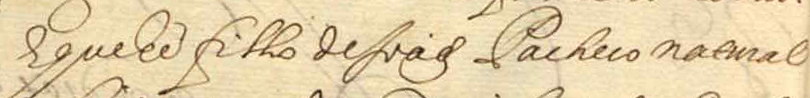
E que he filho de Joaõ Pacheco natural
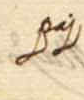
paj
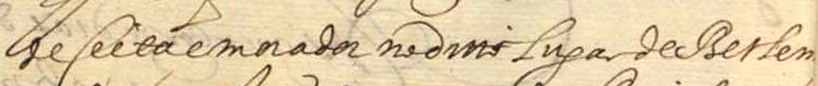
de Ceita e morador no dito Lugar de Betlem
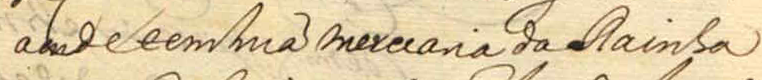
aonde tem huā mercearia da Rainha
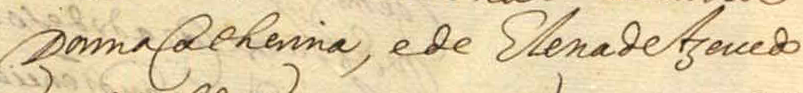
Donna Catherina, e de Elena de Azeuedo
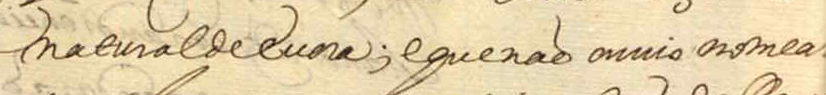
natural de éuora; e que naõ ouuio nomear.
